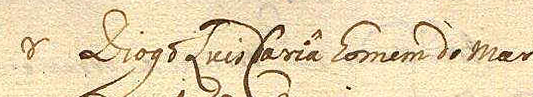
item Diogo Luis Caria homem do mar
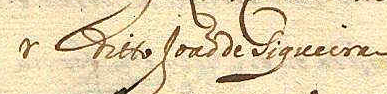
item ditto Joaõ de Siqueira
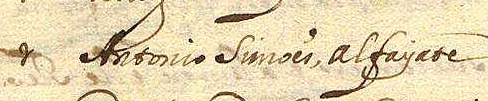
item Antonio Simoẽs, alfayate
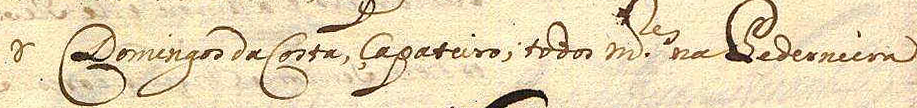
item Domingos da Costa, çapateiro, todos m.res na Pederneira
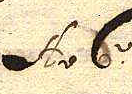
Ao 6.o
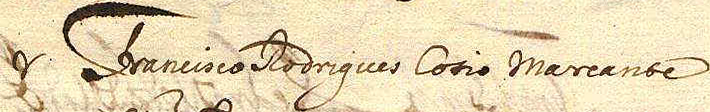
item Francisco Rodrigues Cosio mareante
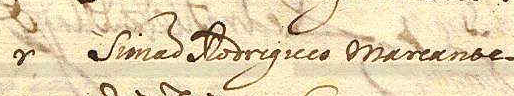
item Simaõ Rodrigues mareante
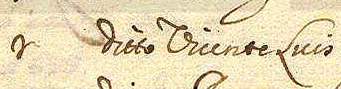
item ditto Vicente Luis
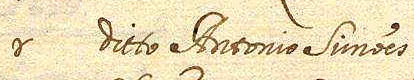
item ditto Antonio Simoẽs
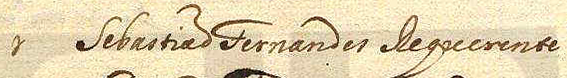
item Sebastiaõ Fernandes Requerente
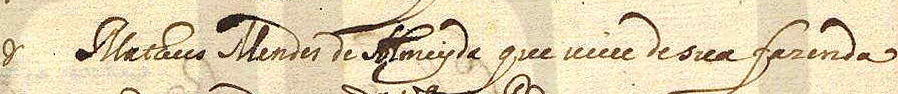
item Matheus Mendes de Almeyda que uiue de sua fazenda
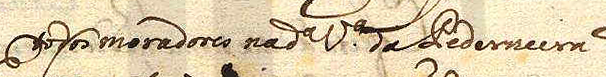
todos moradores na da V.a da Pederneira
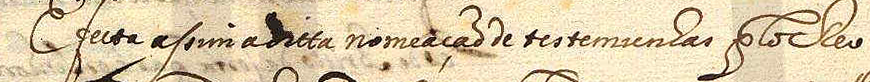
E feita assim a ditta nomeaçaõ de testemunhas plo Reo
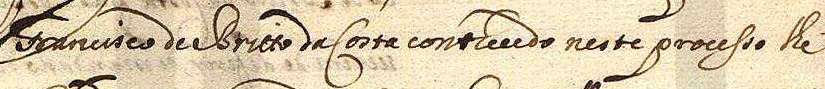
Francisco de Britto da Costa contheudo neste processo lhe
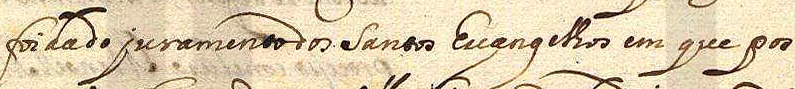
foi dado juramento dos Santos Euangelhos em que pos
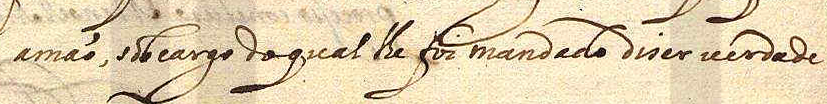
a mão, sob cargo do qual lhe foi mandado diser uerdade
